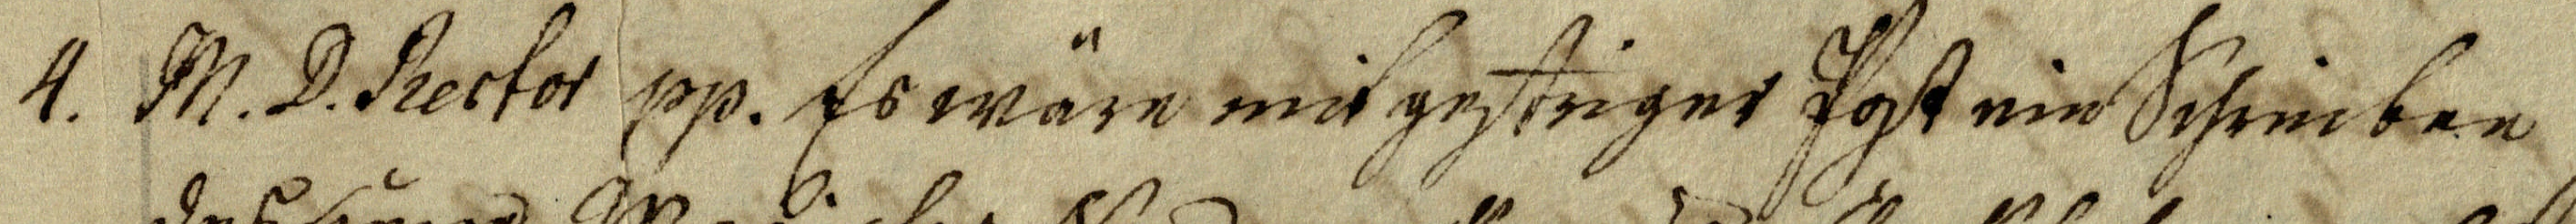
4. M. D. Rector pp. Es wäre mit gestriger Post ein Schreiben
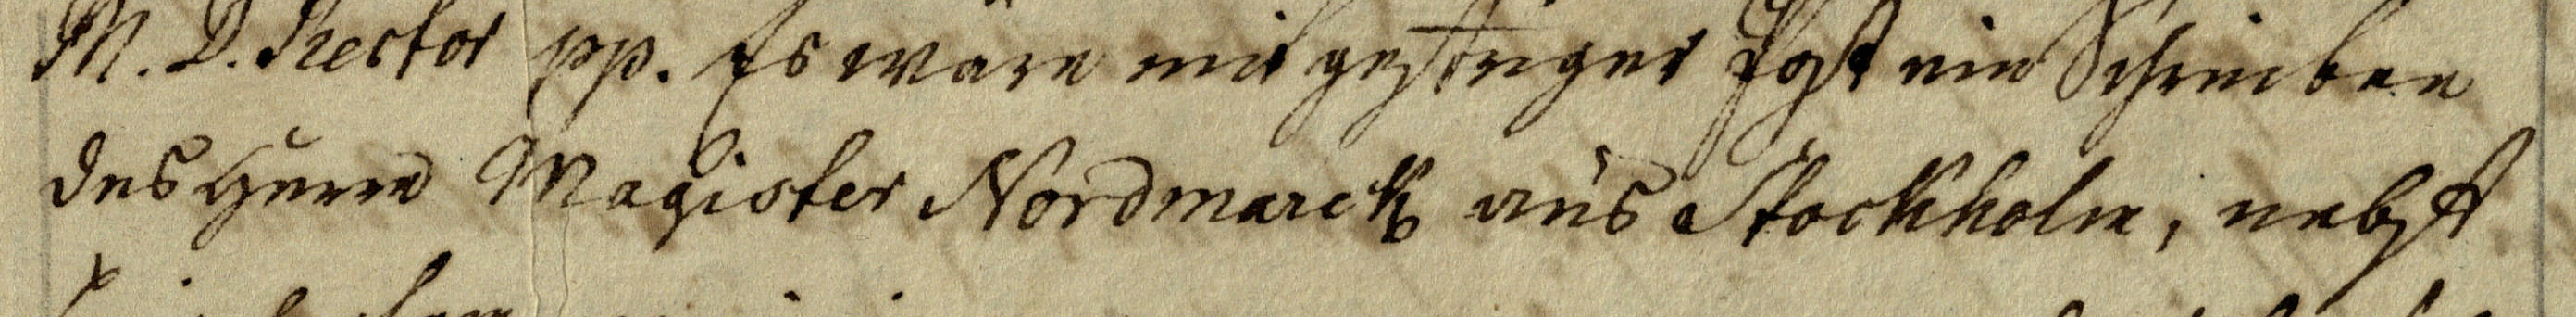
des Herr Magister Nordmarck aus Stockholm, nebst
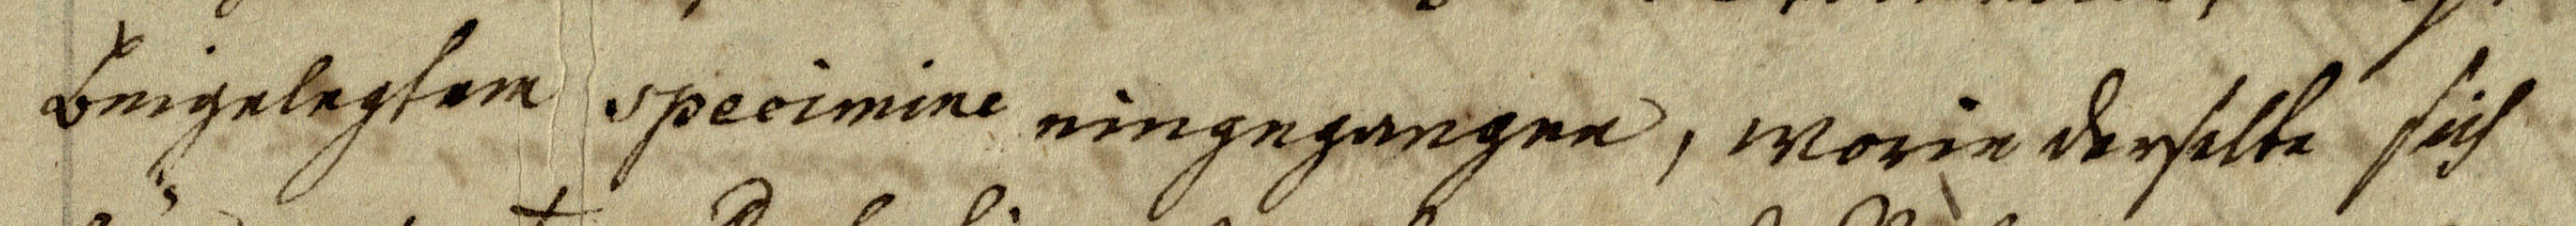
beigelegtem specimine eingegangen, worin derselbe sich
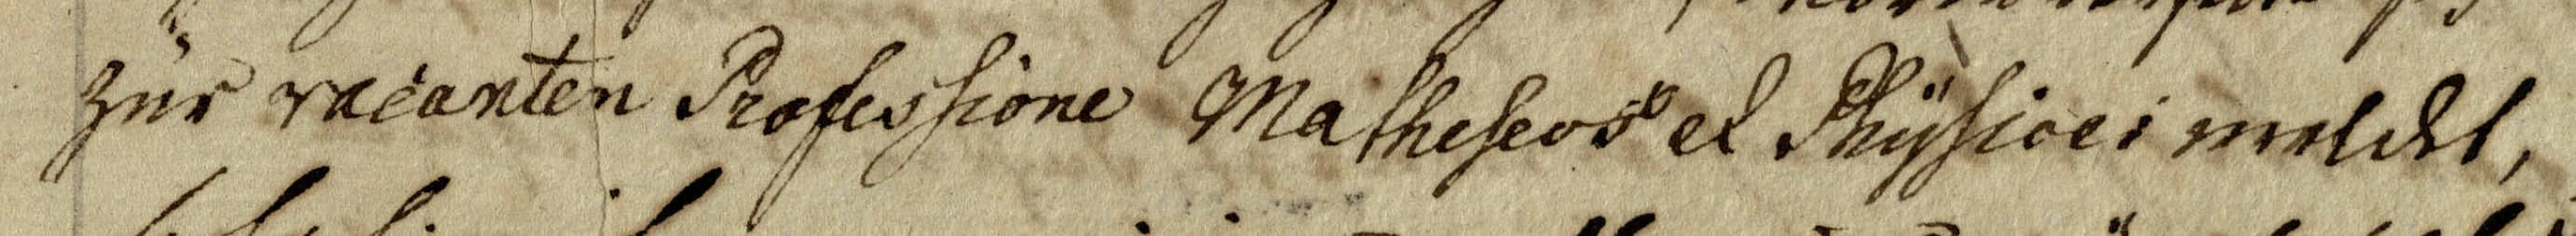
zur vacanten Professione Matheseos et Phÿsicei meldet,
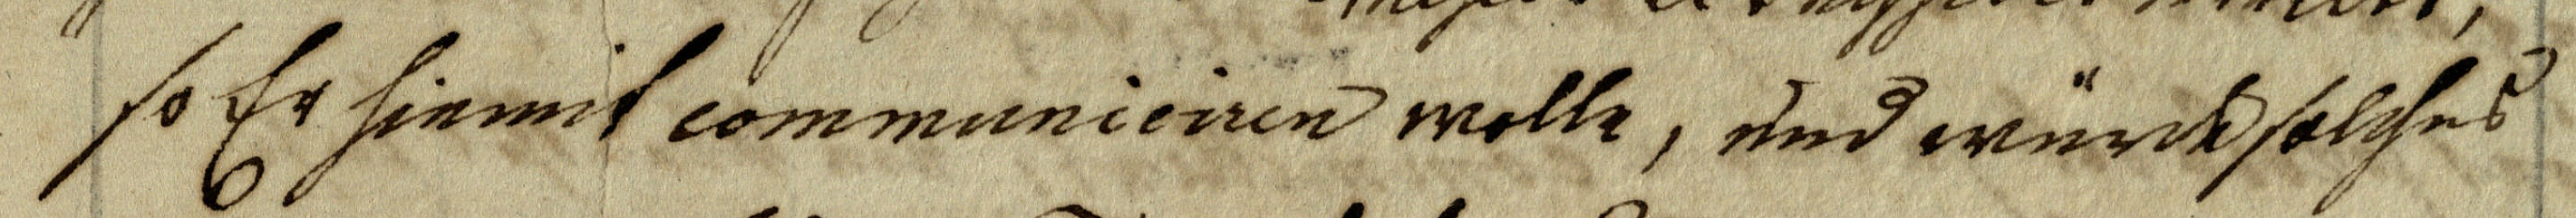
so Er hiemit communiciren wolle, und wünsche solches
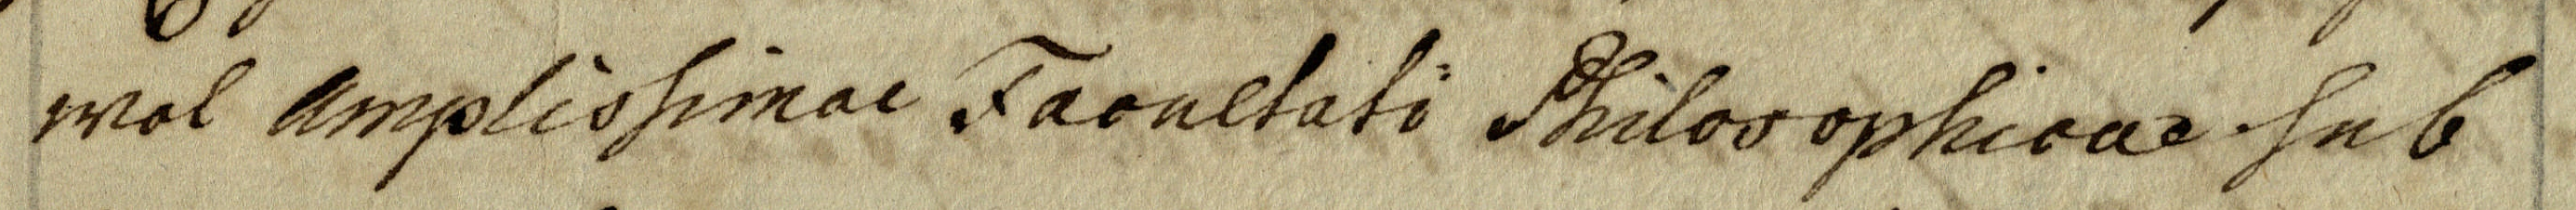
wol Amplissimae Facultati Philosophicae sub
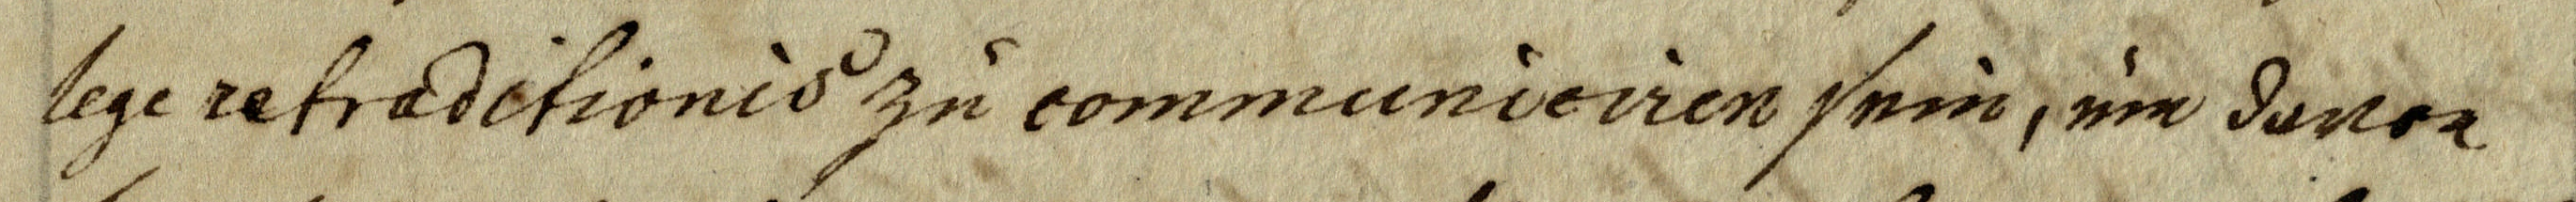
lege retraditionis zu communiciren sein, um davon
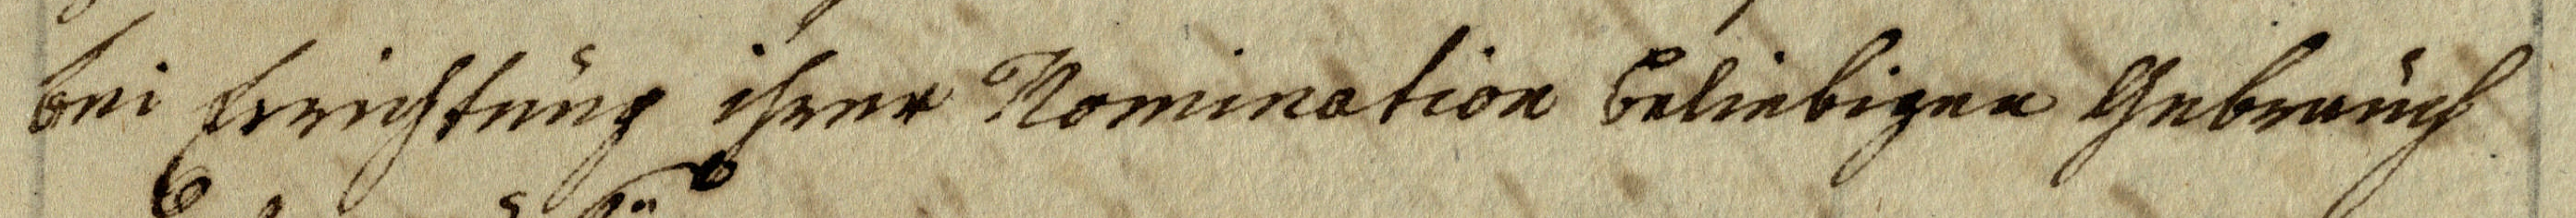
bei Errichtung ihrer Nomination beliebigen Gebrauch
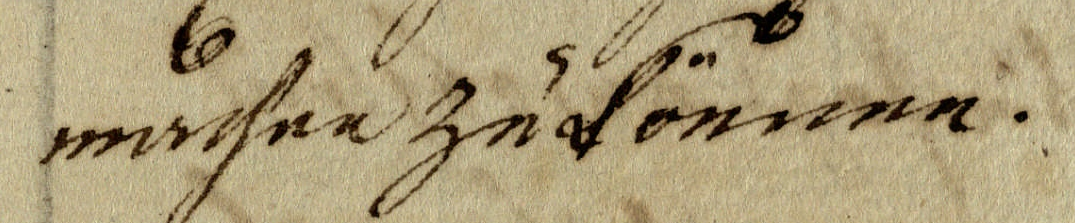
machen zu können.
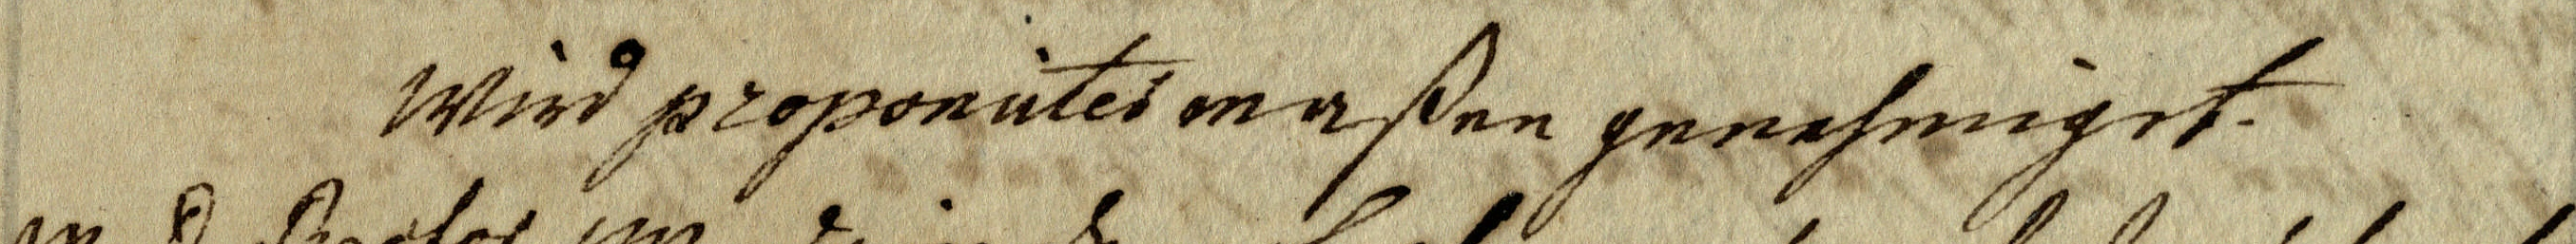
Wird proponirter maaßen genehmiget.
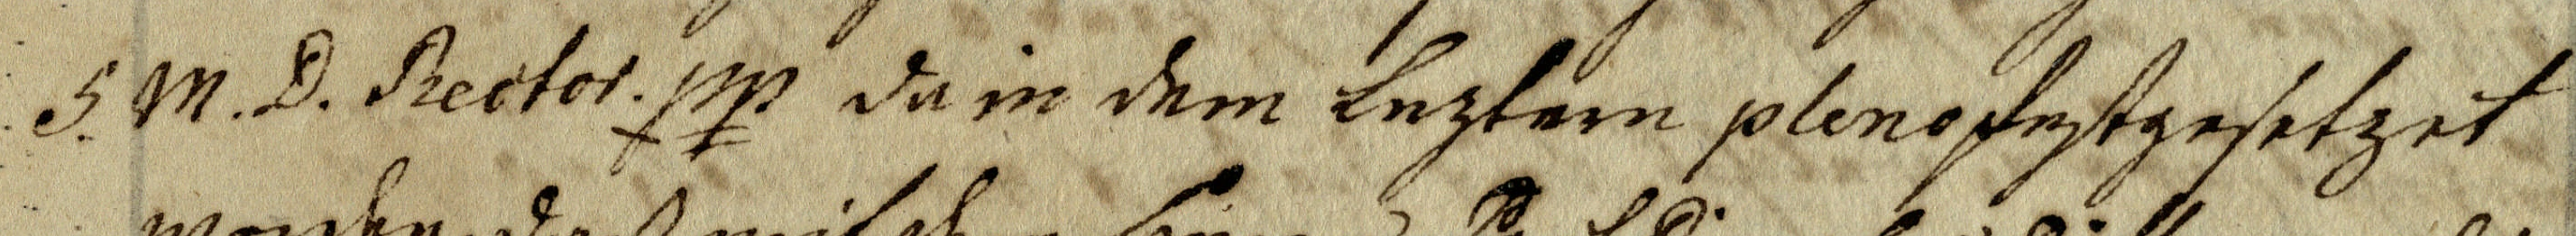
5. M. D. Rector pp Da in dem lezten pleno festgesetzet
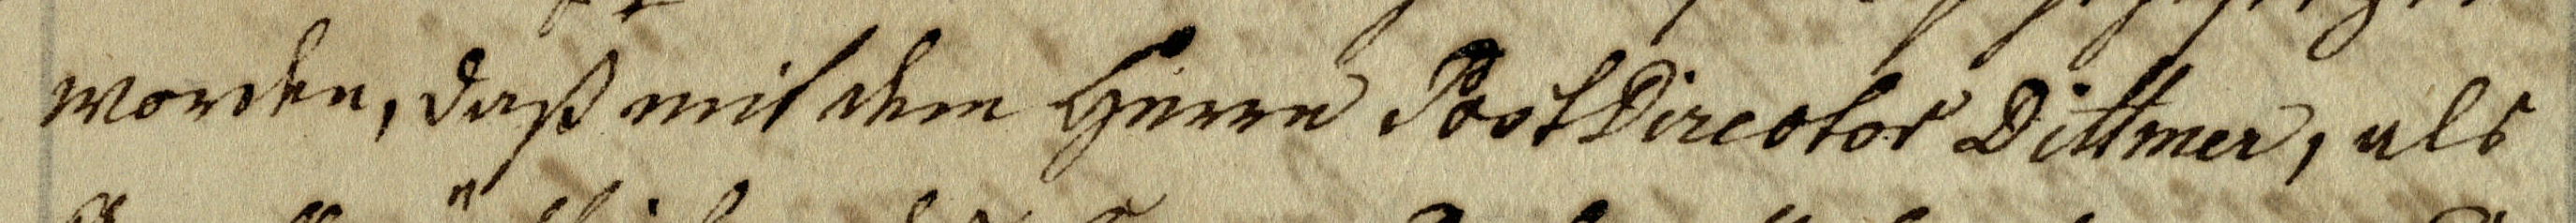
worden, daß mit dem Herr PostDirector Dittmer, als
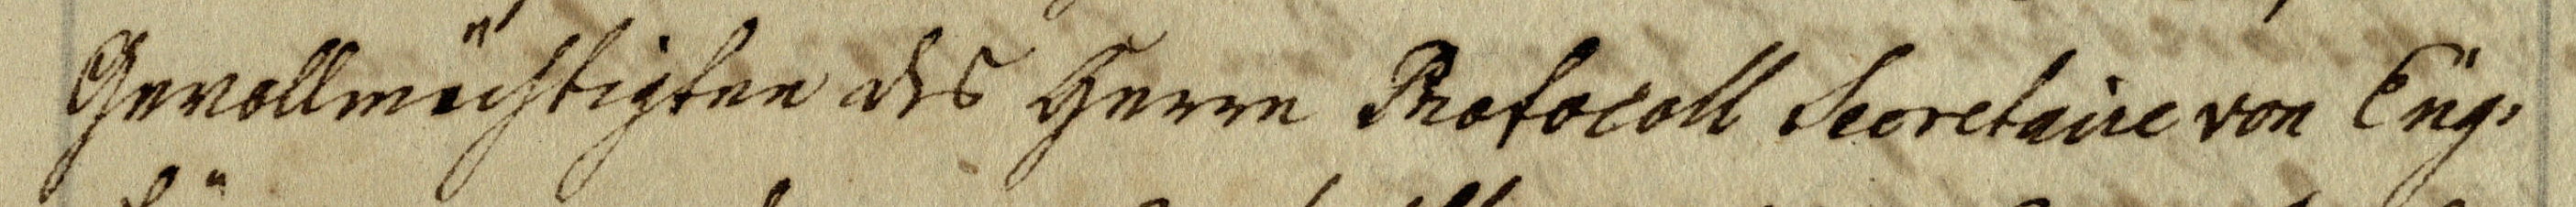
Gevollmächtigten des Herrn Protocoll Secretaire von Eng¬
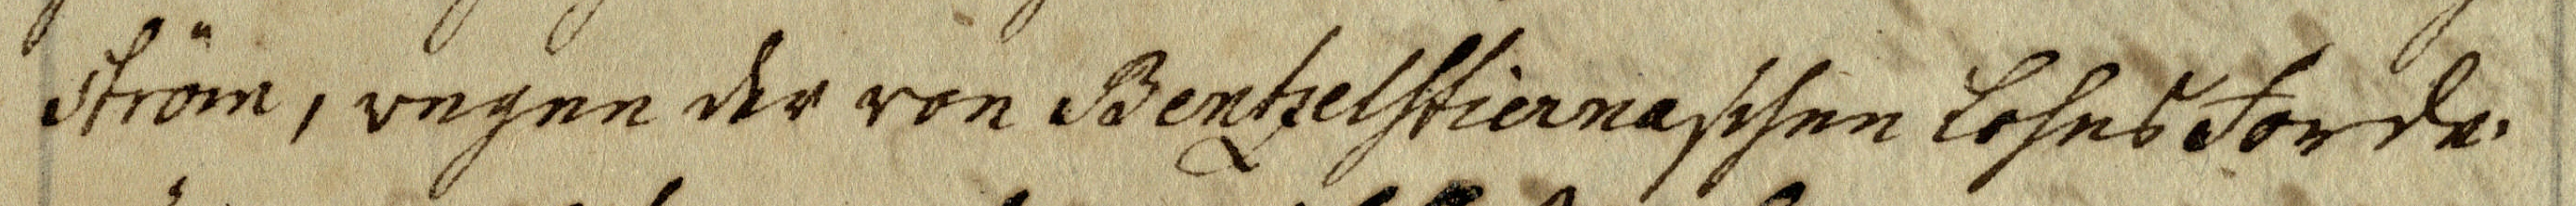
ström, wegen der von Bentzelstiernaschen Lohns Forde¬
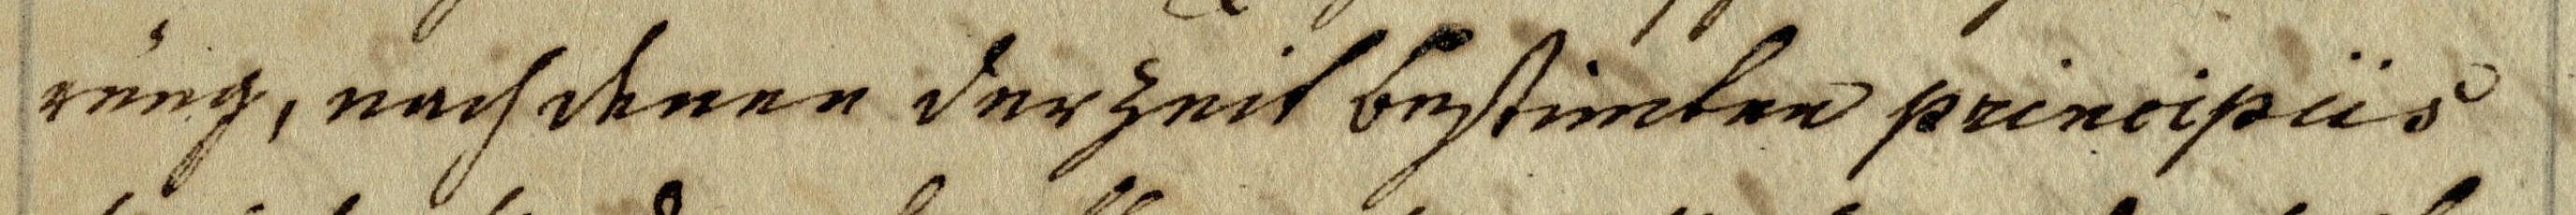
rung, nach denen derzeit bestimten principiis
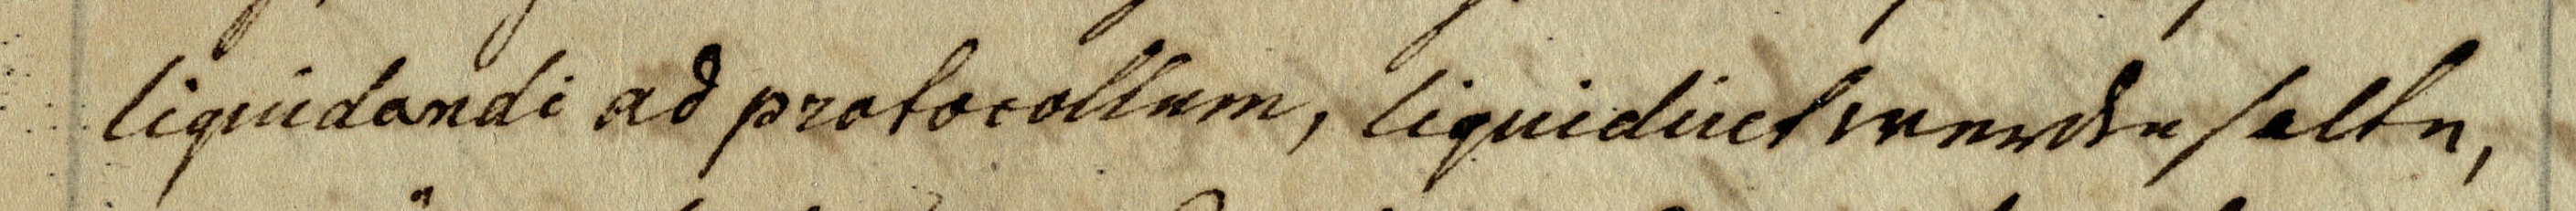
liquidandi ad protocollum, liquidiret werden solte,
